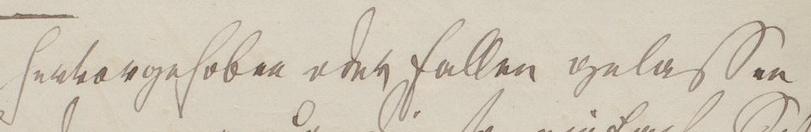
hevorgehoben oder fallen gelassen
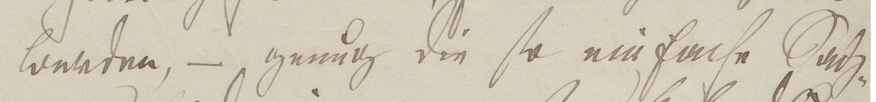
werden,– genug die so einfache Sach-
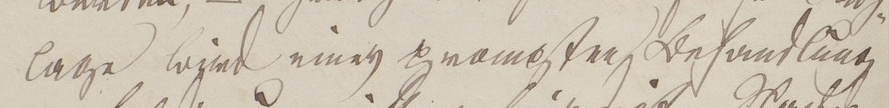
lage wird einer prompten Behandlung
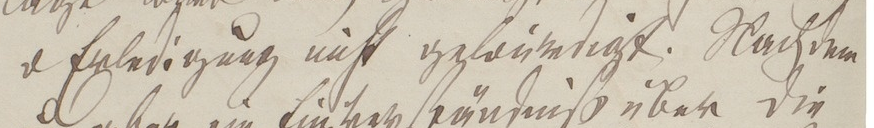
& Erledigung nicht gewürdigt. Nachdem
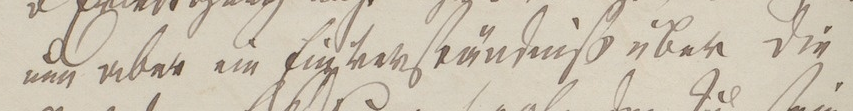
nun aber ein Einverständniß über die
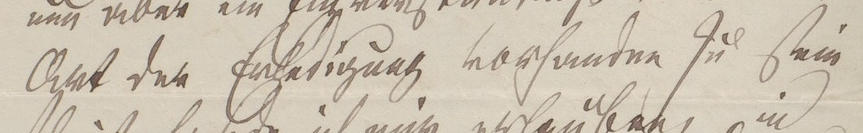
Art der Erledigung vohanden zu sein
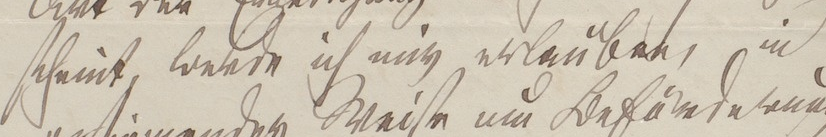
scheint, werde ich mir erlauben, in
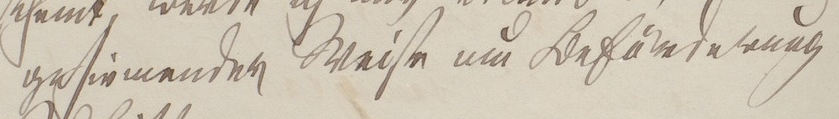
geziemender Weise um Beförderung
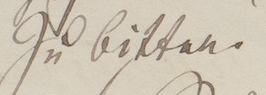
zu bitten.
